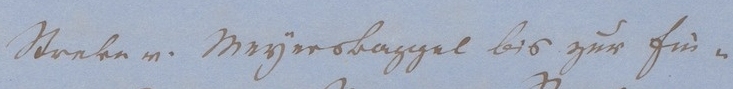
Streke v. Meyerskappel bis zur Ein-
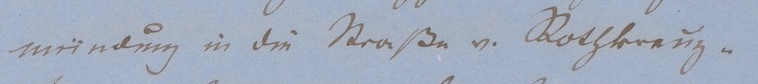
mündung in die Straße v. Rothkreuz -
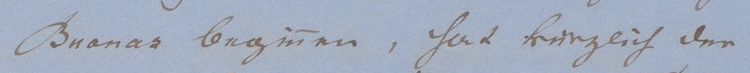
Buonas beginnen, hat kürzlich der
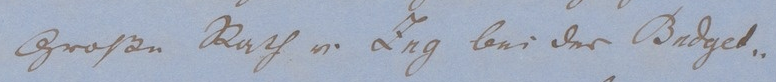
Große Rath v. Zug bei der Budget -
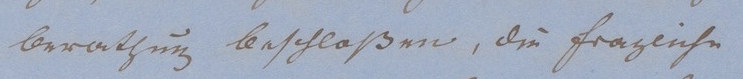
berathung beschloßen, die fragliche
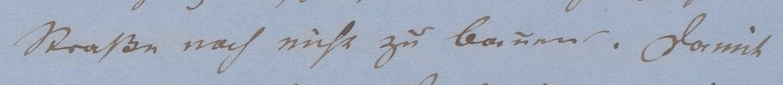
Straße noch nicht zu bauen. Damit
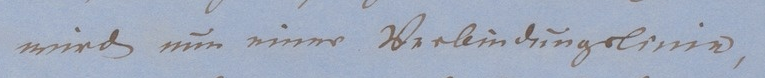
wird nun einer Verbindungslinie,
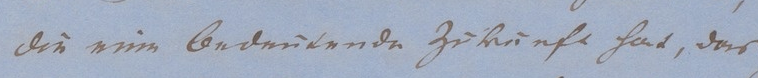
die eine bedeutende Zukunft hat, das
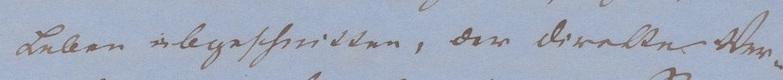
Leben abgeschnitten, der direkte Ver-
